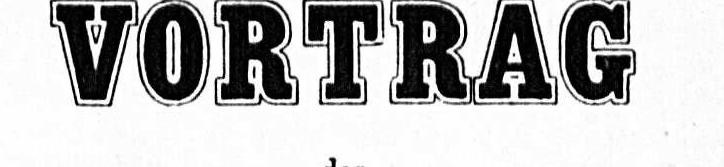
Vortrag
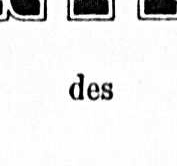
des
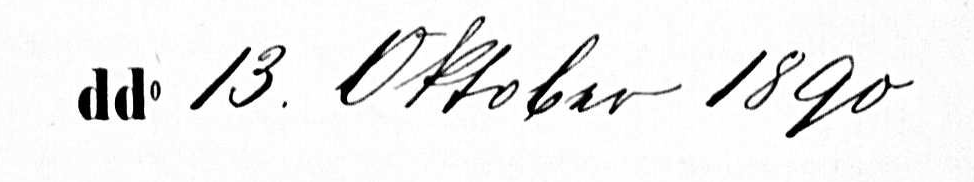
ddo 13. Oktober 1890
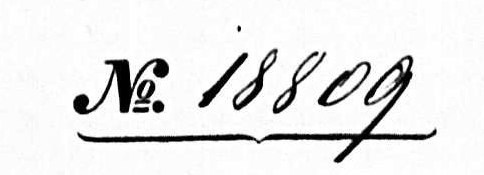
No. 18809
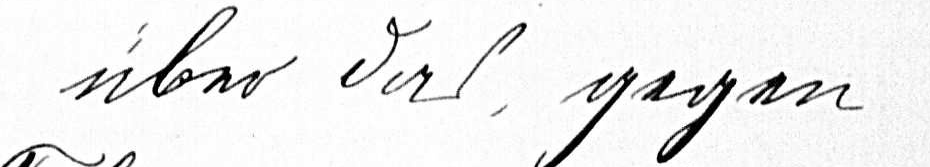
über da, gegen
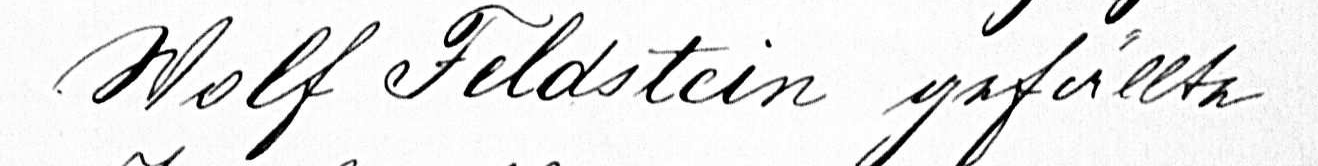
Wolf Feldstein gefällte
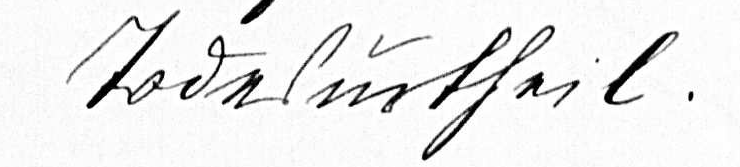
Todesurtheil.
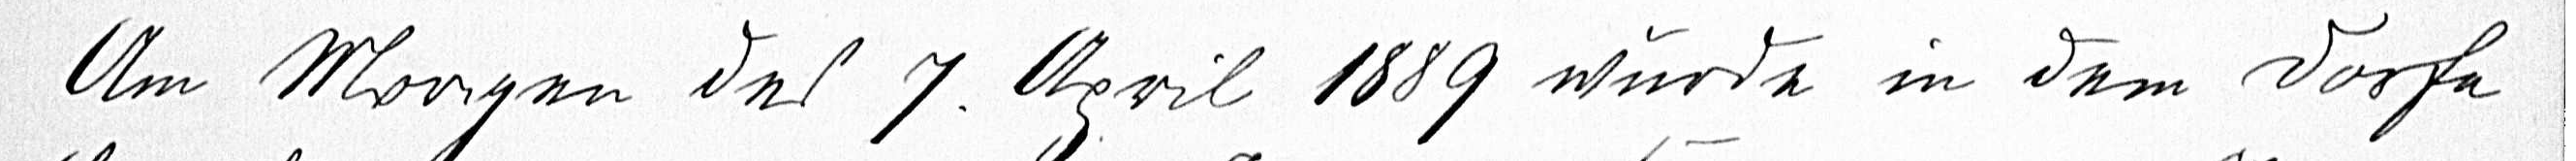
Am Morgen des 7. April 1889 wurde in dem Dorfe
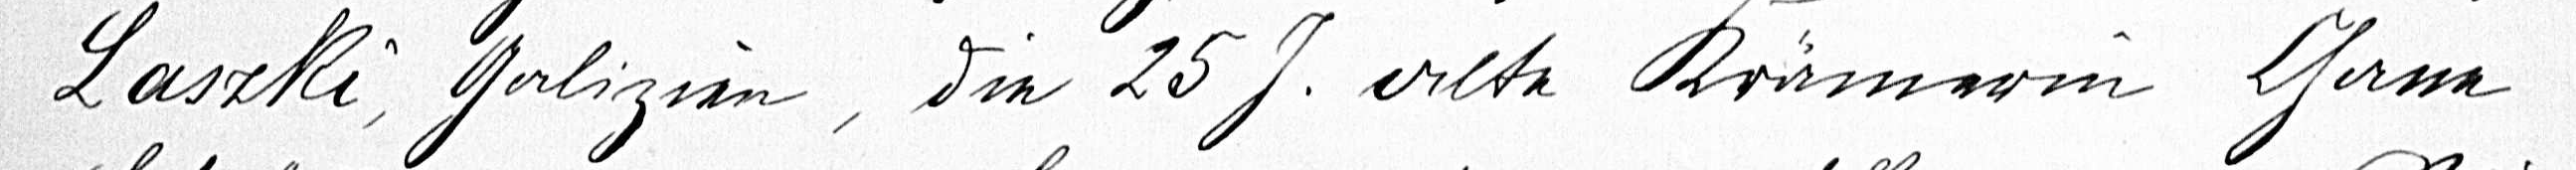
Laszki, Galizien, die 25 J. alte Krämerin Chane
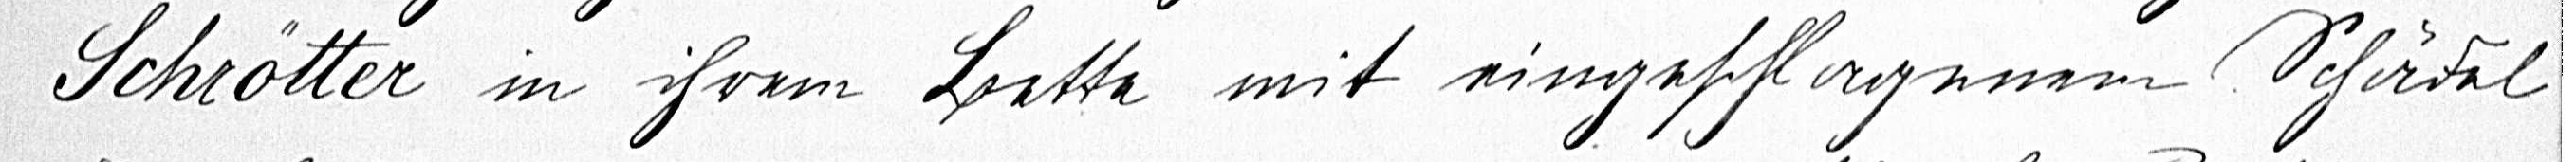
Schrötter in ihrem Bette mit eingeschlagenem Schädel
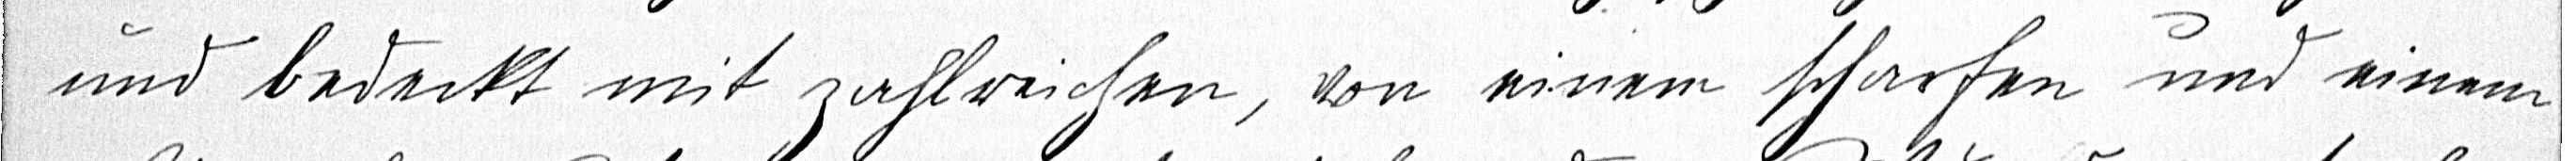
und bedeckt mit zahlreichen, von einem scharfen und einem
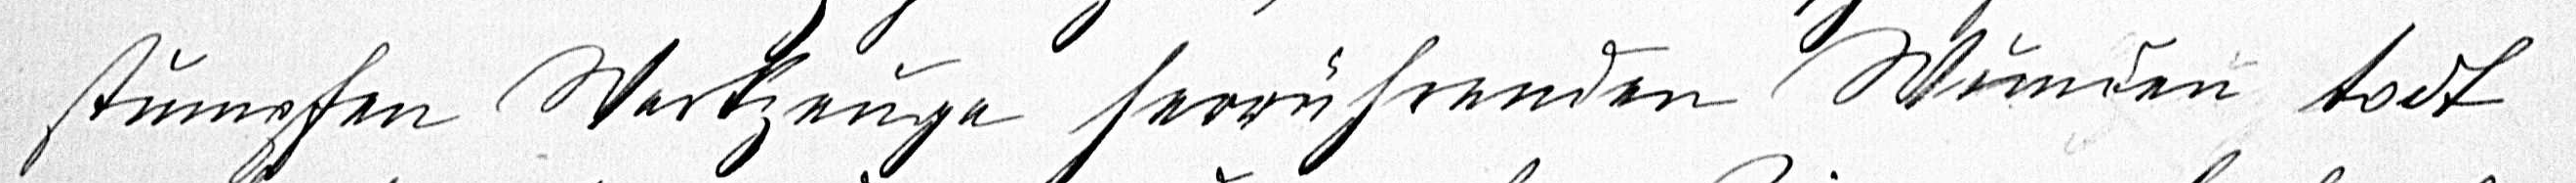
stumpfen Wertzeuge herrührenden Wunden todt
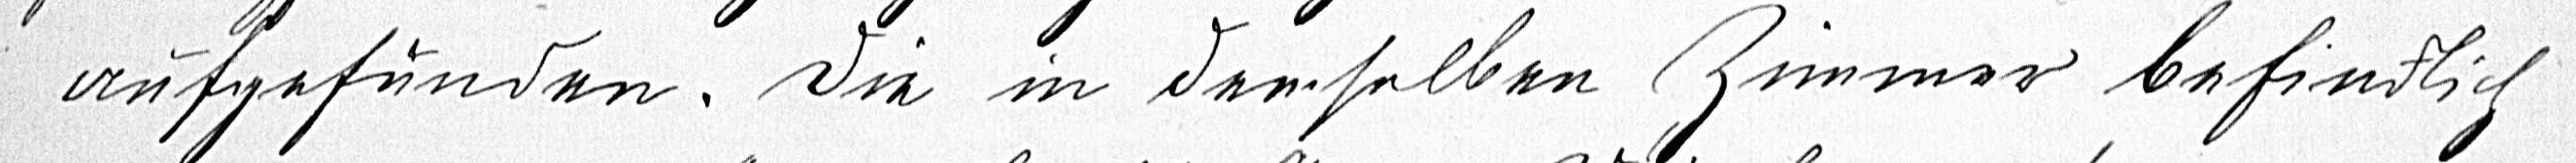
aufgefunden. Die in derselben Zimmer befindlich
